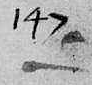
147
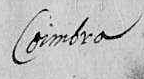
Coimbra
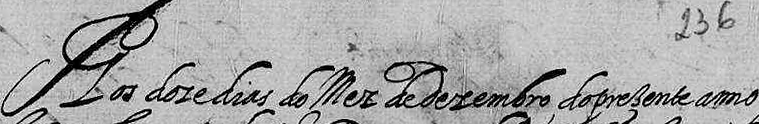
Aos doze dias do Mez de dezembro, do prezente anno
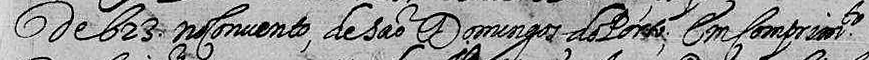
de 623. no Conuento, de saõ Domingos do Porto; Em Comprim.to
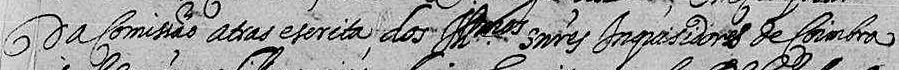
Da Comissão atras escrita, dos Jll.mos snrēs Inquisidores de Coimbra
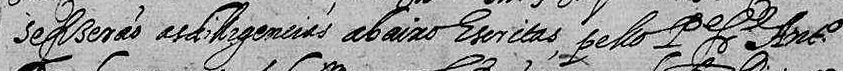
se fizeraõ as dilligencias abaixo Escritas, pello Pe fr Ant.o
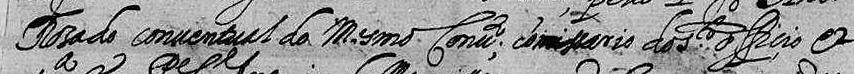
Rozado conuentual do mesmo Conuto; cōmissario do s.to officio &
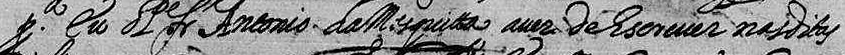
ꝑ.a eu o Pe fr Antonio da Mesquitta auer de Escreuer nas ditas
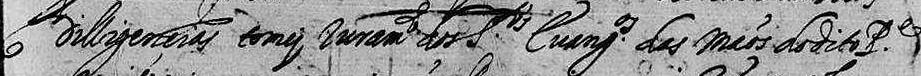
dilligencias tomej Iuramto dos S.tos Euang.os das maõs do dito P.e
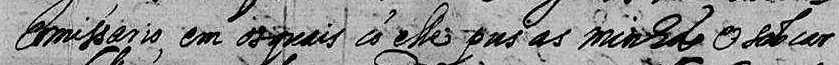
comissario, em os quais cō elle pus as minhas & sob car
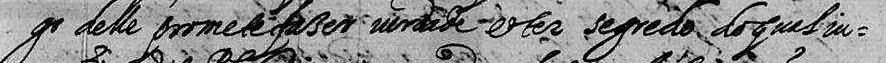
go delle promete fazer uerdade & ter segredo do qual iu
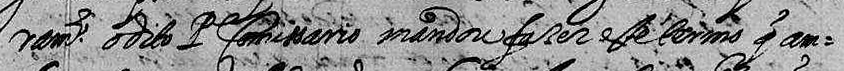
ram.to o dito Pe Comissario mandou fazer este termo q̄ am
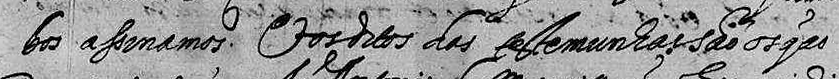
bos assinamos. & os ditos das testemunhas são os q̄ ao
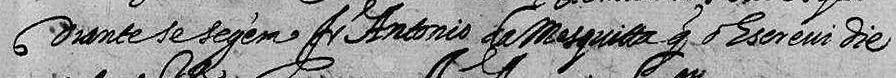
diante se segem fr Antonio da mesquitta q̄ o Escreui die
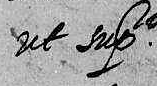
ut sup.ra
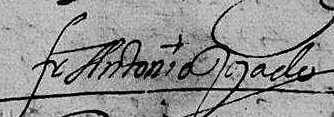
fr Antonio Rozado
